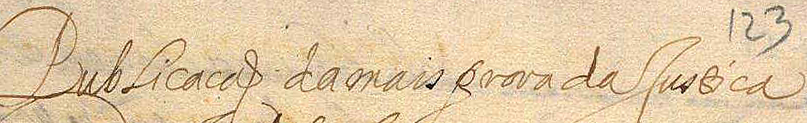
Publicacaõ da mais prova da Justica
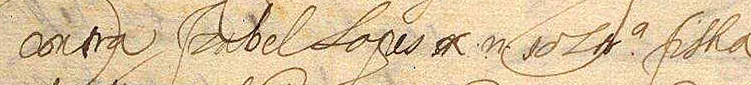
contra Jzabel Lopes x.n. soltr.a filha
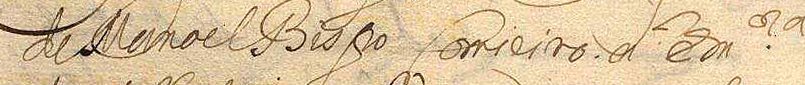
de Manoel Bispo Corrieiro. nl e m.ora
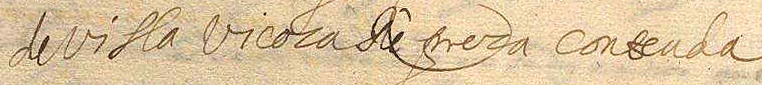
de villa vicoza Rè preza conteuda
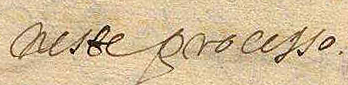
neste processo.
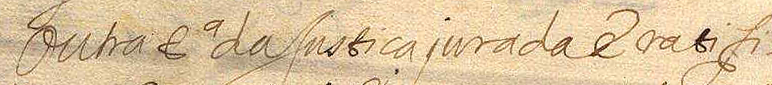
Outra ta da Justica jurada e ratifi
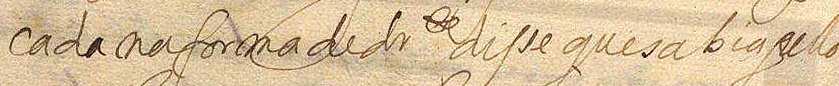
cada na forma de drto disse que sabia pello
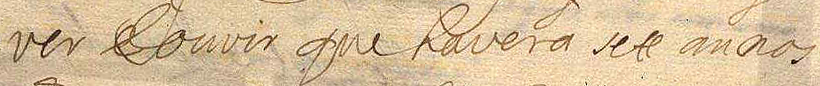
ver e ouvir que haverà sete annos
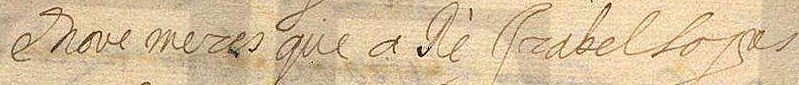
e nove mezes que a Rè Jzabel lopes
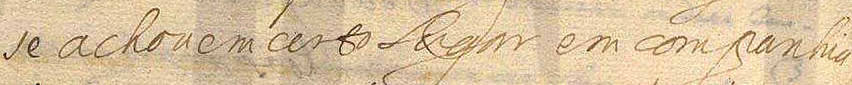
se achou em certo lugar em companhia
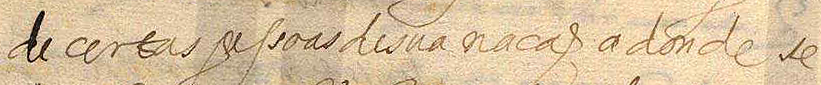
de certas pessoas de sua nacaõ adonde se
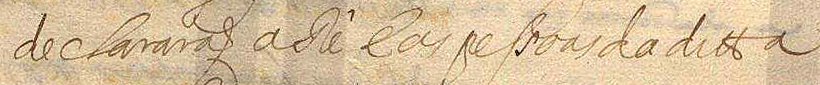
declararaõ a Rè e as pessoas da ditta
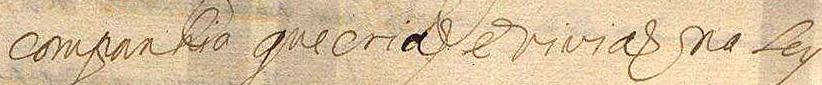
companhia que criaõ e viviaõ na Ley
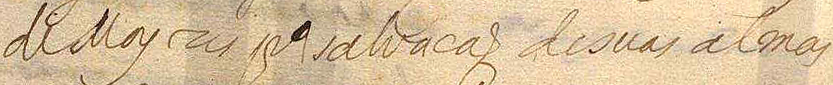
de Moyzes pa saluacaõ de suas almas
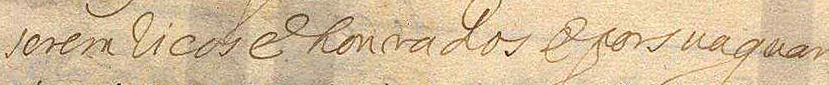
serem Ricos e honrados e por sua guar
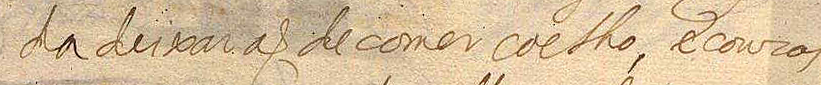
da deixaraõ de comer coelho, e couzas
